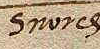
Snores
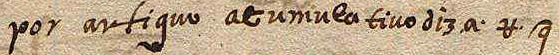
por artiguo acumulatiuo diz a R. q̄
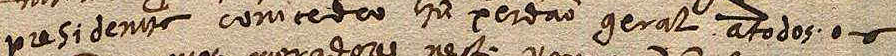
presidemte comcedeo hū perdão geraL a todos os
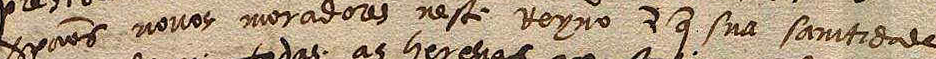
Xpaõs nouos moradores neste Reyno ē q̄ sua samtidade
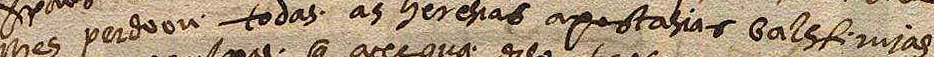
lhes perdoou todas. as heresias apostasias balsfemjas
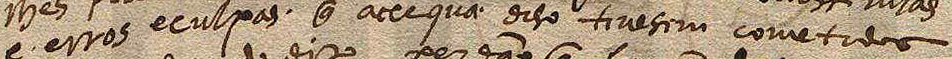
e erros e culpas. q̄ acerqua diso tiuesem cometidos
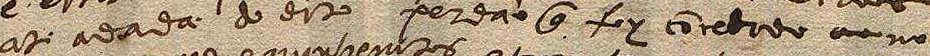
ate a dada do dito perdão q̄ foy cōcedido ao no
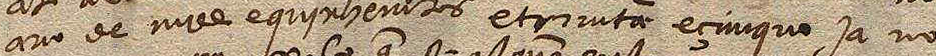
ano de mill e qujnhemtos e trimta e çimquo Ja no
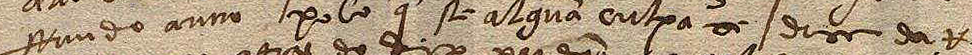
ffim do anno polo q̄ se algūa culpa se dise da R
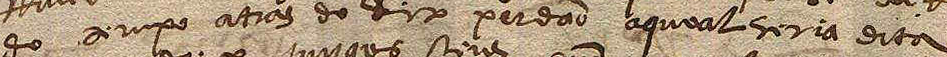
do tempo atras do dito perdão a quoaL seria dita
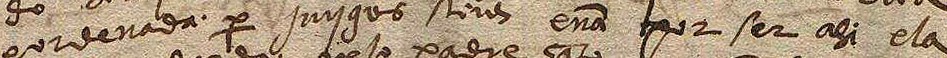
e ordenada ꝑ Jmjgos seus e nā por ser asi ela
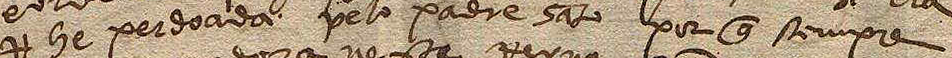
R he perdoada pelo padre sāto porq̄ sempre
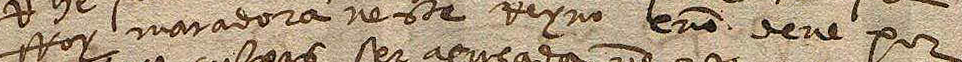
ffoy maradora neste Reyno e nō deue por
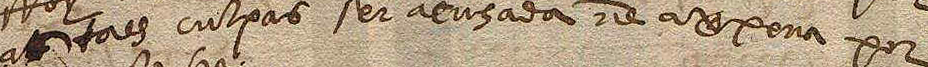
as taes culpas ser acusada n̄e aꝟ pena por
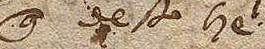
q̄ desto he.
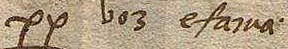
ꝑꝑca voz e fama
